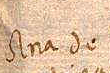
Ana de
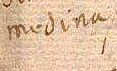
medina
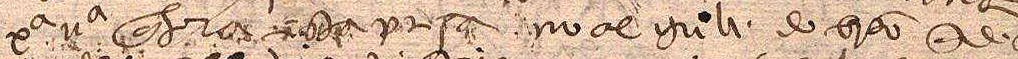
xa na q̄ hora esta presa no algube do bpō q̄ des
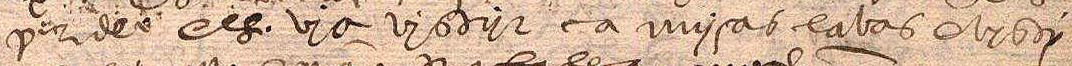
perdeo e lhe vya vystyr camysas lavas e vysty
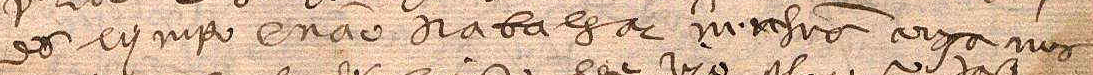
dos lympo e não trabalhar nenhuā cousa nos
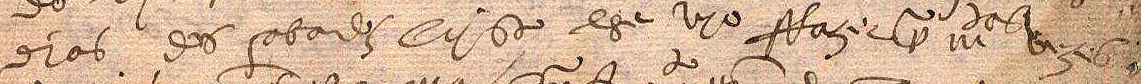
dias dos sabados e ysto lhe vyo ffazer p̄o mtas vezes
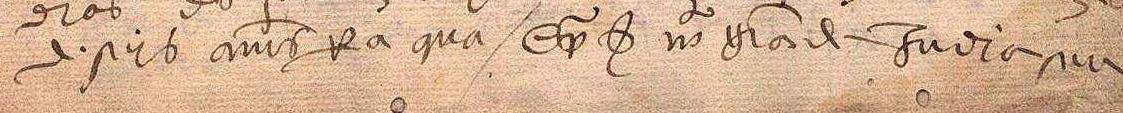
de seys anos ꝑa qua / e p̄o ꞩ mto grāde Judia seu
